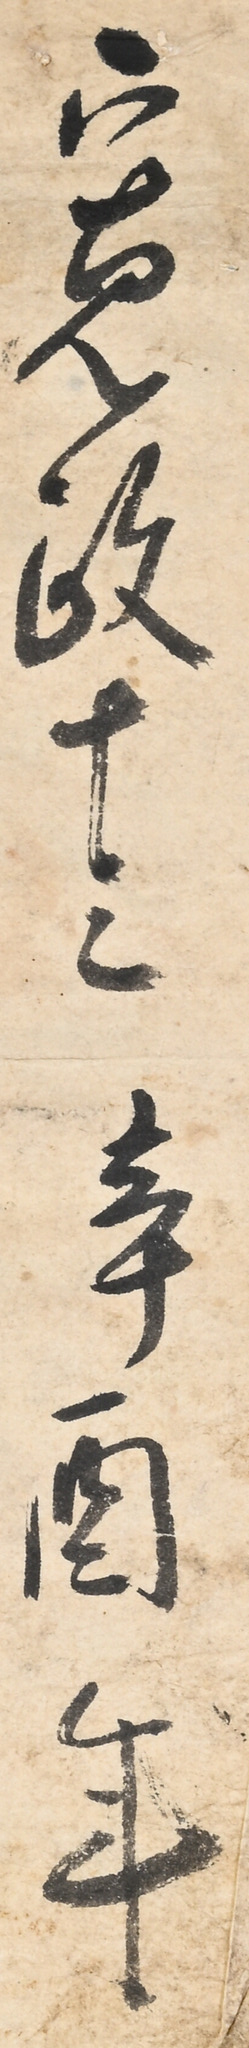寛政十三辛酉年
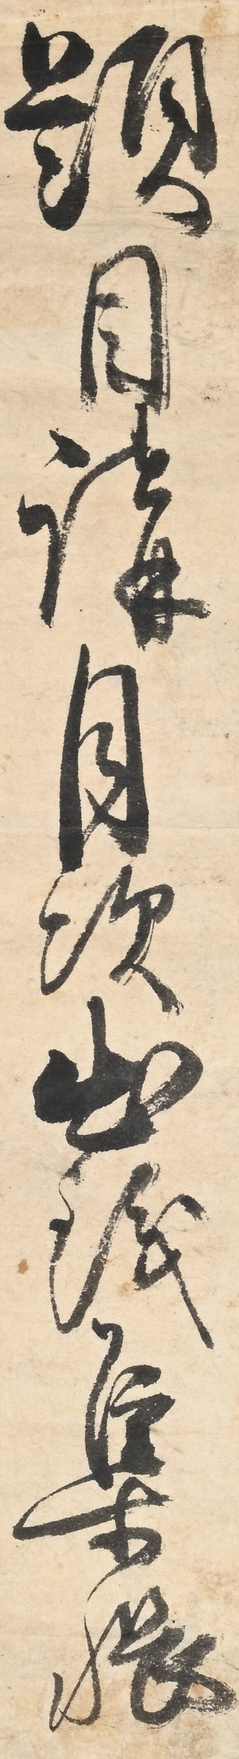題目講月次出銭集帳

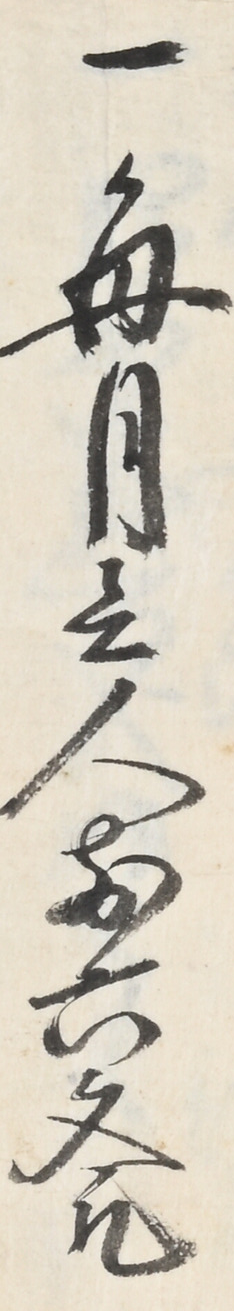一毎月壱人前六文充
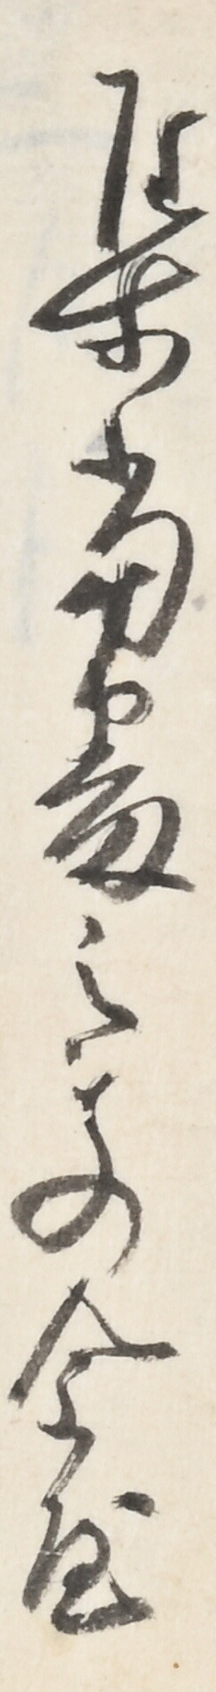集当番之もの金屋
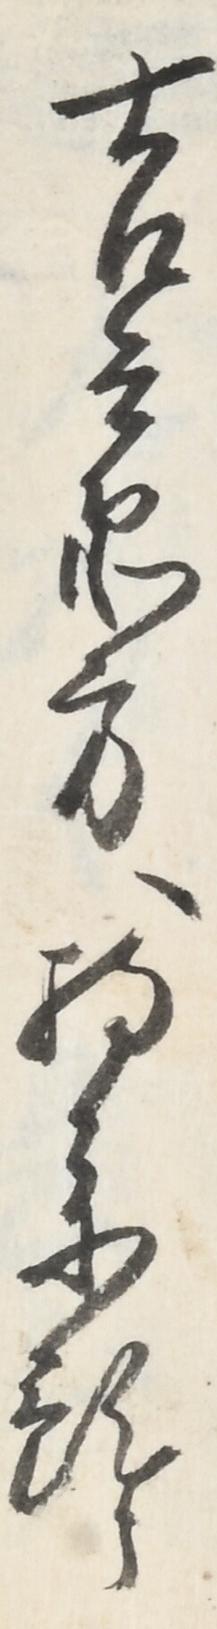吉兵衛方へ持参預ヶ
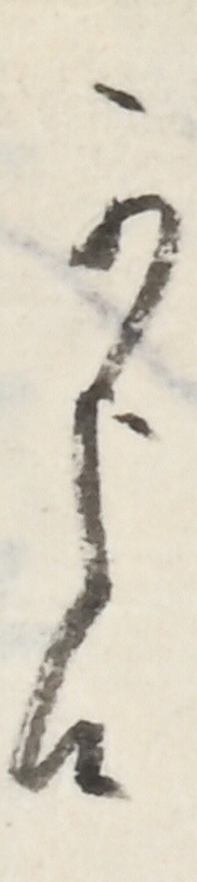可申候
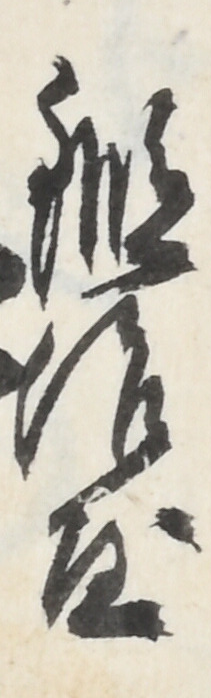鍛冶屋
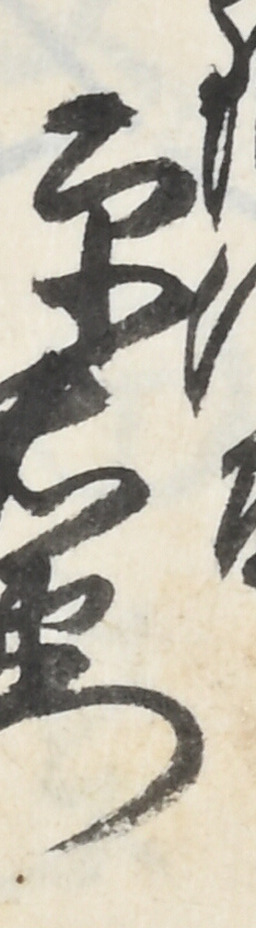源右衛門

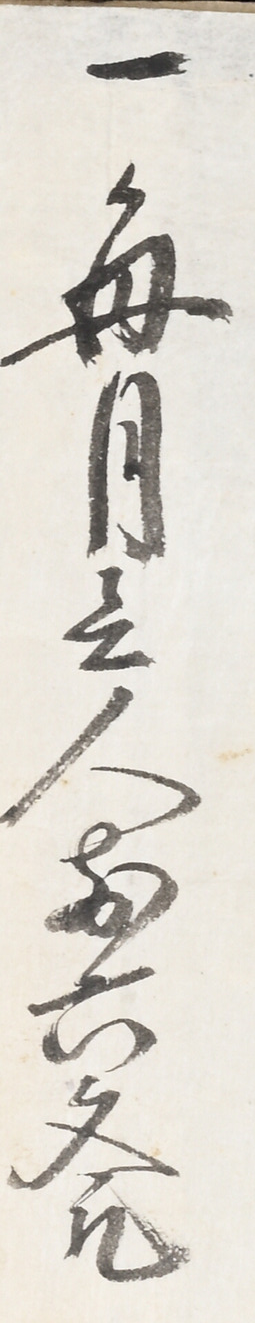一毎月壱人前六文充
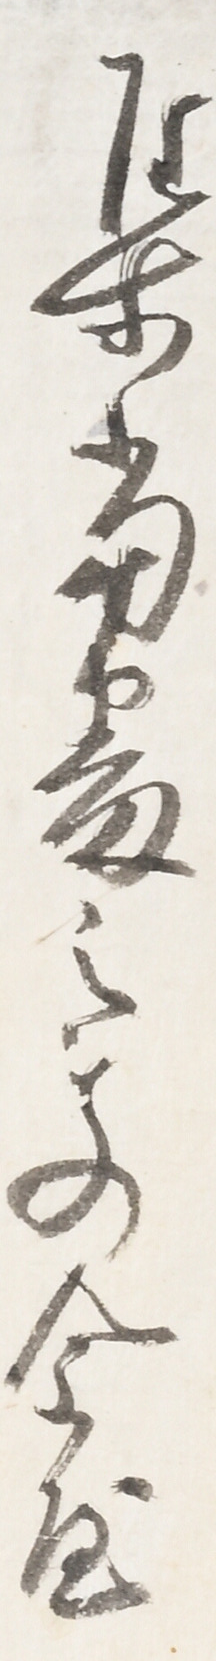集当番之もの金屋
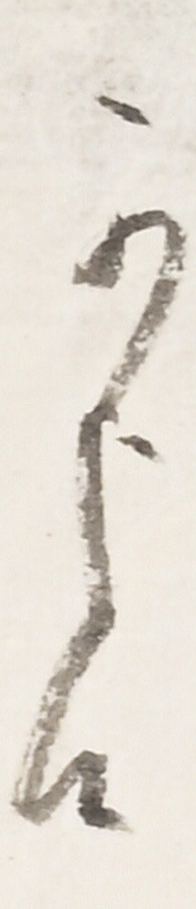可申候
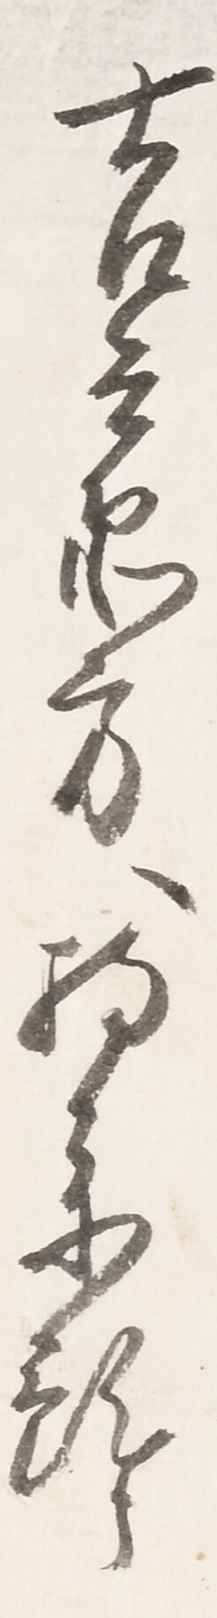吉兵衛方へ持参預ヶ
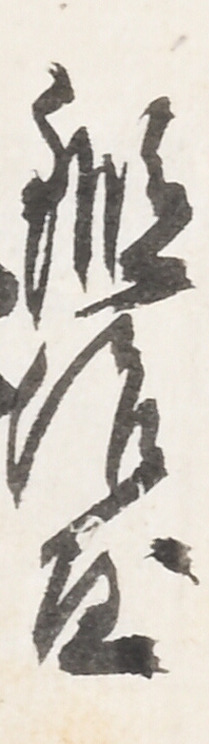鍛冶屋
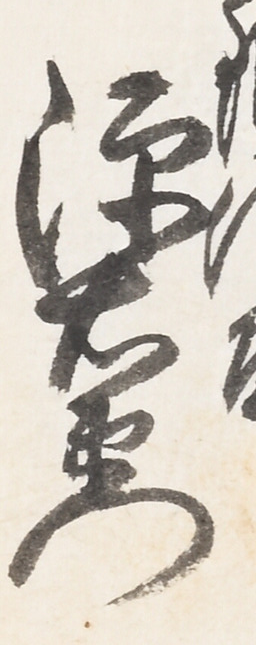源右衛門
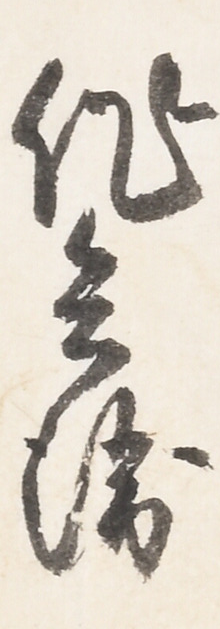作兵衛
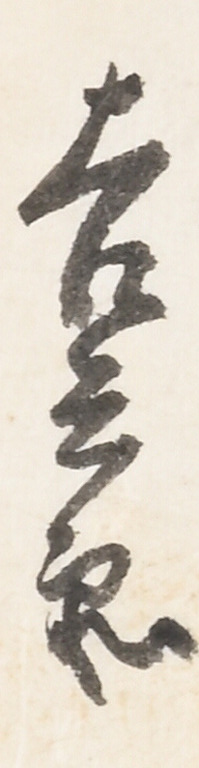吉兵衛
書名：題目講月次出銭集帳
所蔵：伊那市立高遠町図書館・合同会社AMANE
